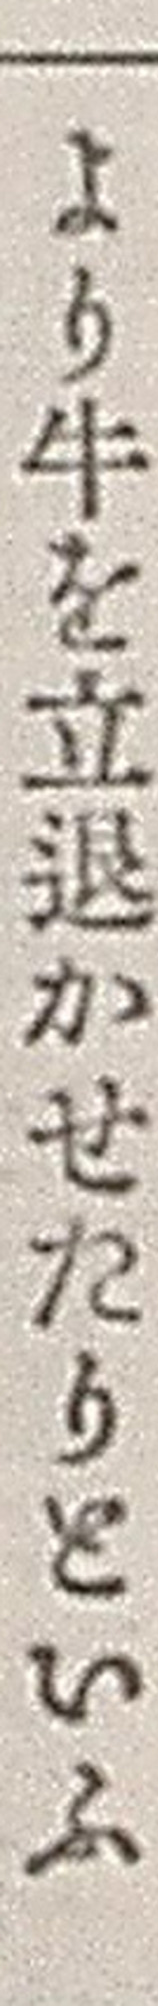より牛を立退かせたりといふ
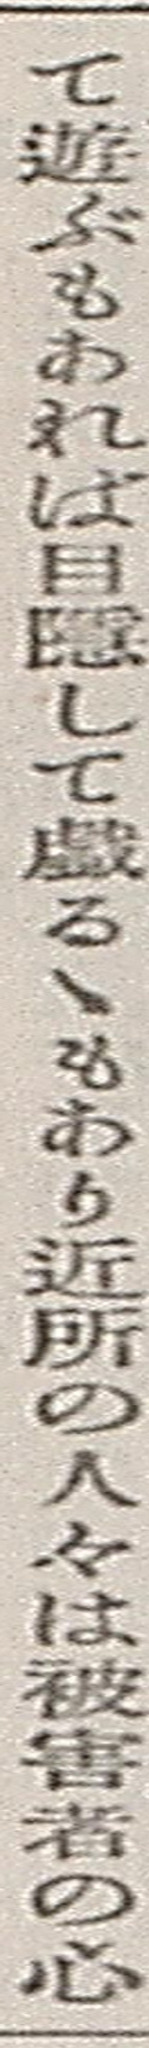て遊ぶもあれば目隠して戯るヽもあり近所の人々は被害者の心
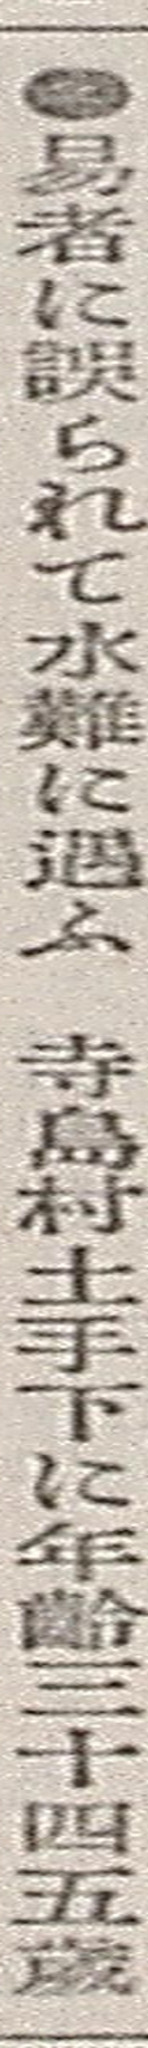●易者に誤られて水難に遇ふ寺島村土手下に年齢三十四五歳
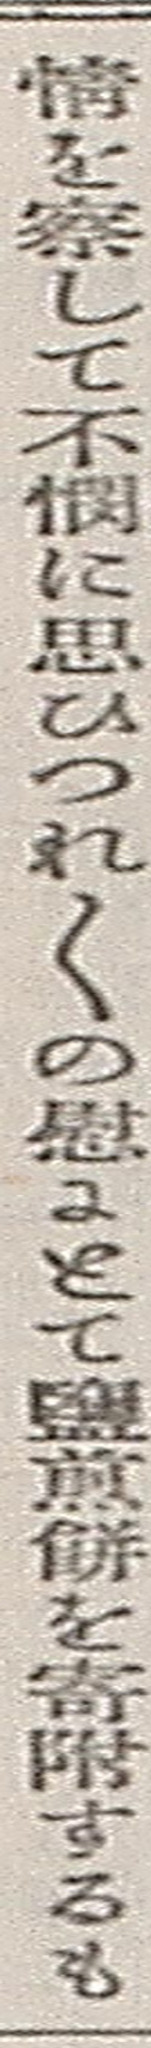情を察して不憫に思ひつれ〳〵の慰にとて塩煎餅を寄附するも
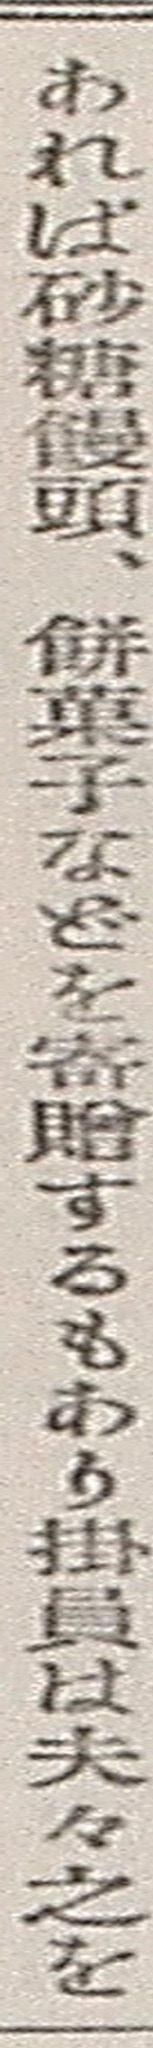あれば砂糖饅頭、餅菓子などを寄贈するもあり掛員は夫々之を
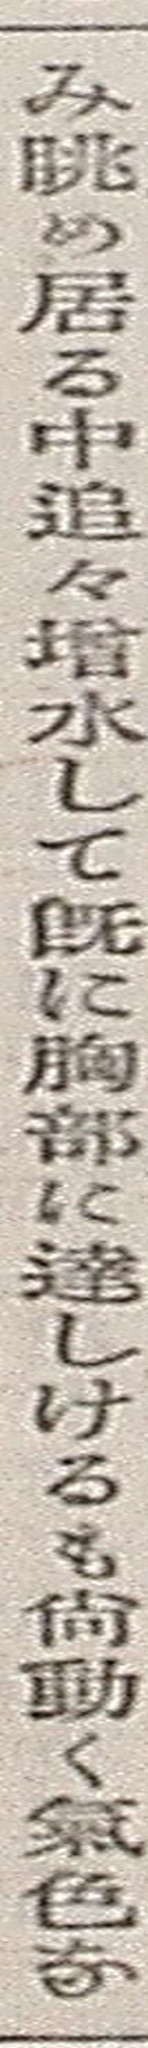み眺め居る中追々増水して既に胸部に達しけるも尚動く気色な
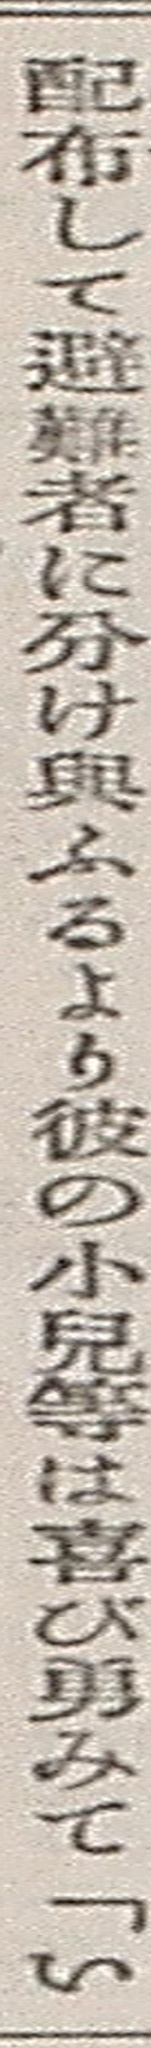配布して避難者に分け与ふるより彼の小児等は喜び勇みて「い
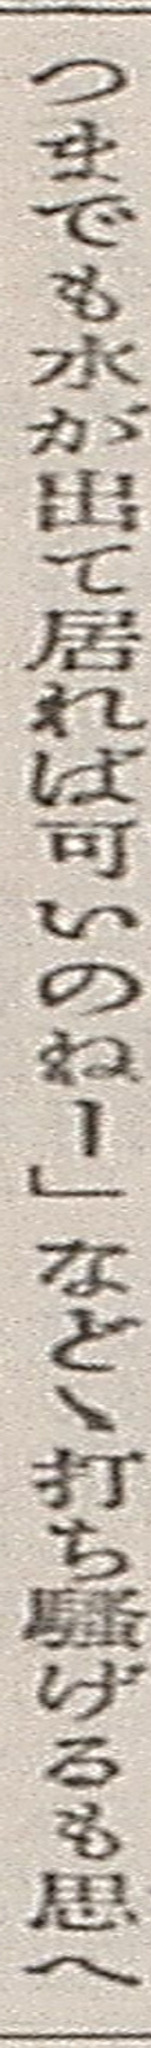つまでも水が出て居れば可いのねー」などヽ打ち騒げるも思へ
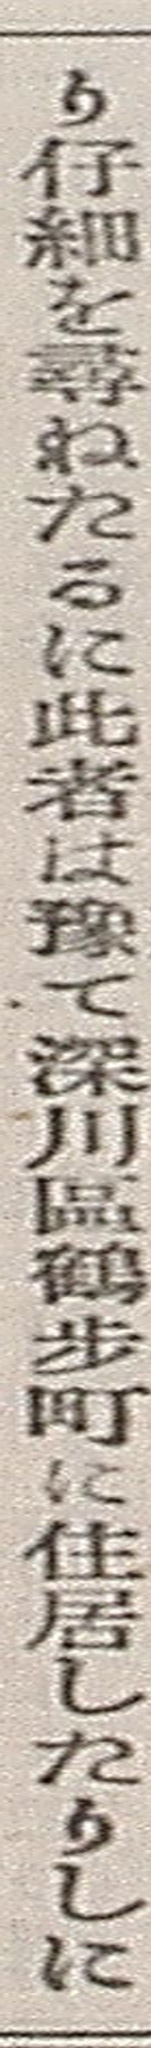り仔細を尋ねたるに此者は豫て深川区鶴歩町に住居したりしに
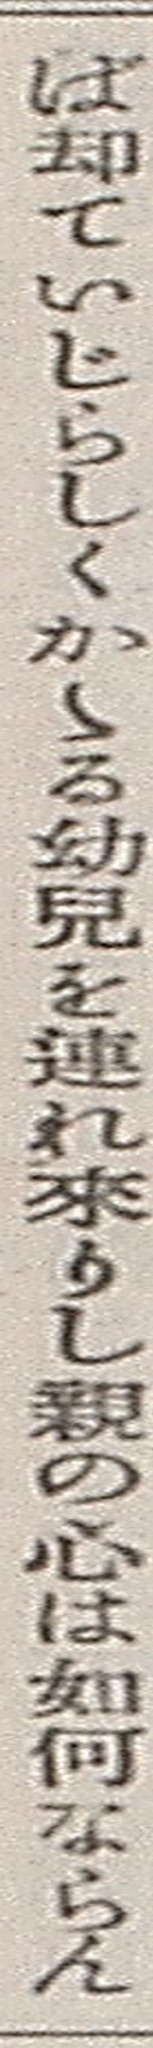ば却ていじらしくかゝる幼児を連れ来りし親の心は如何ならん
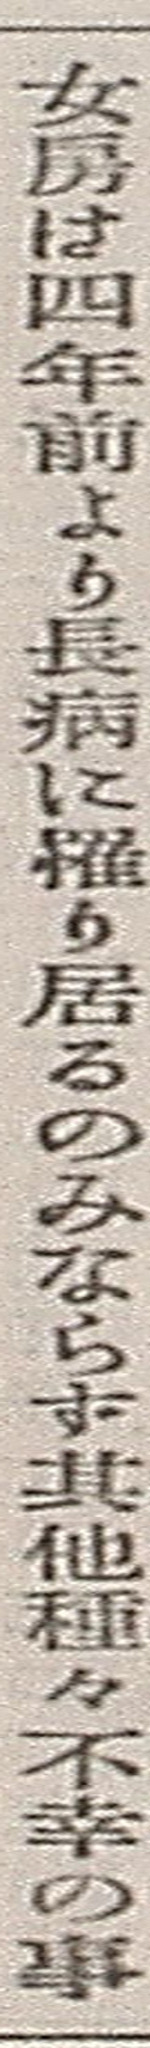女房は四年前より長病に罹り居るのみならず其他種々不幸の事
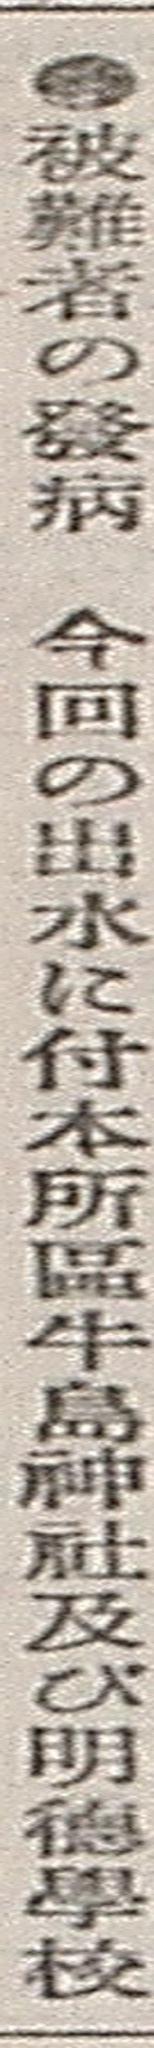●避難者の発病今回の出水に付本所区牛島神社及び明徳学校
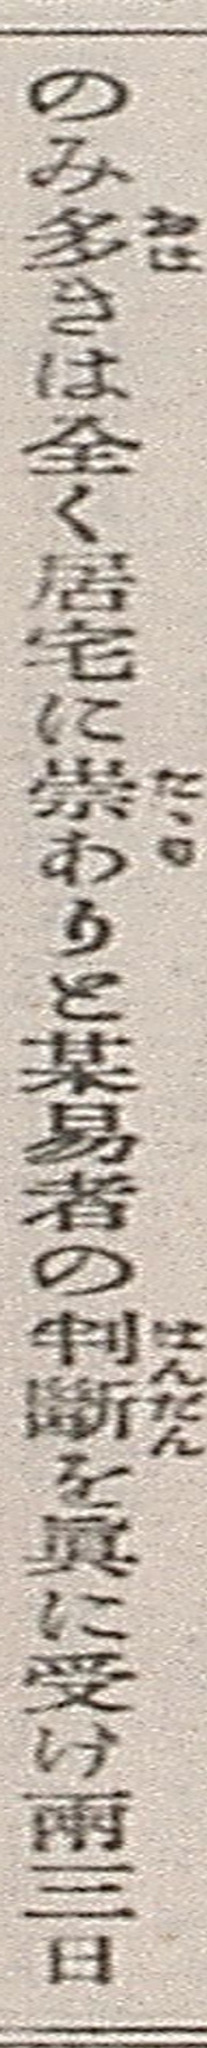のみ多きは全く居宅に祟ありと某易者の判断を真に受け両三日
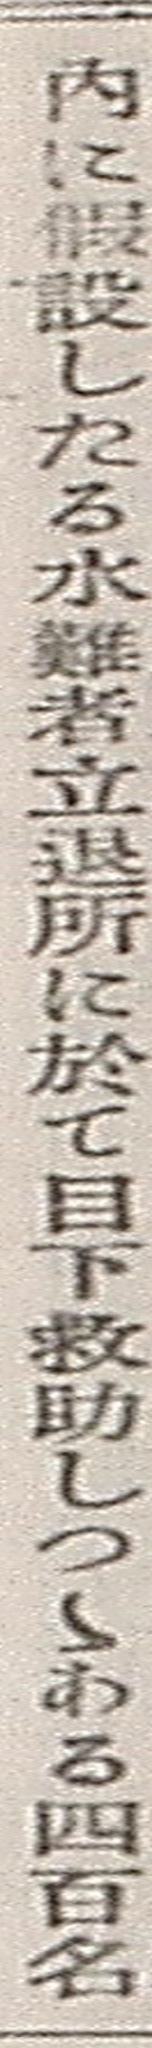内仮設したる水難者立退所に於て目下救助しつゝある四百名
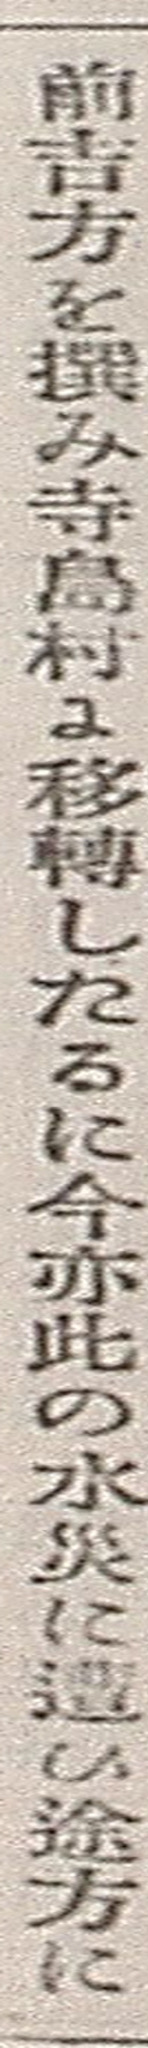前吉方を択み寺島村に移転したるに今亦此の水災遭ひ途方に
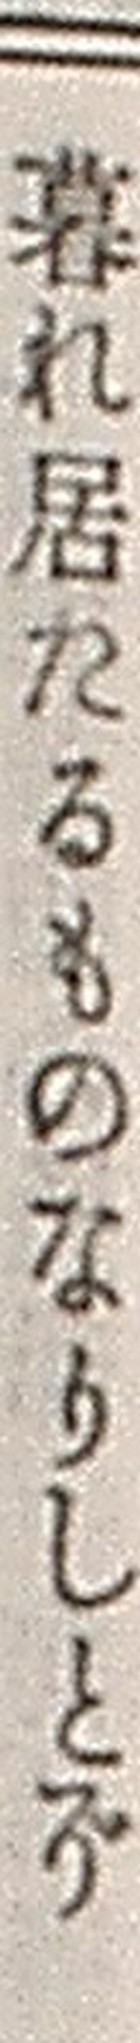暮れ居たるものなりしとぞ
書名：風俗畫報臨時増刊第百二十四號　洪水地震被害録（上）
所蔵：東京大学地震研究所図書室 Earthquake Research Institute Library, The University of Tokyo, JAPAN
